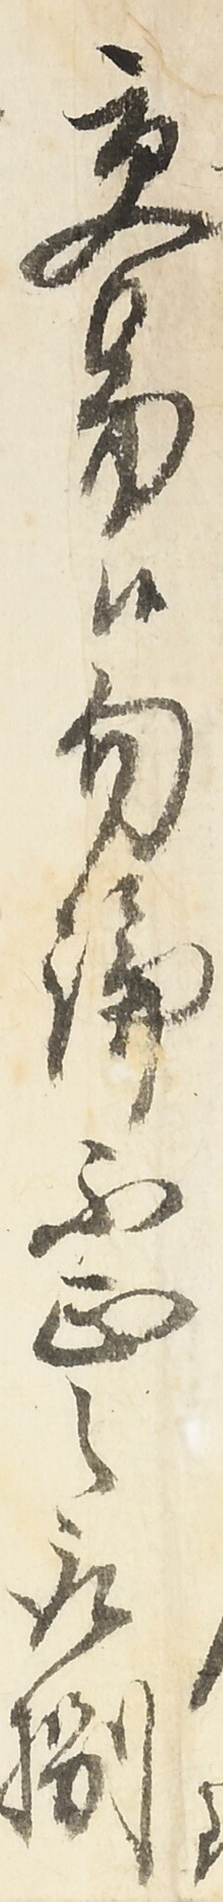交易候勿論不正之取捌
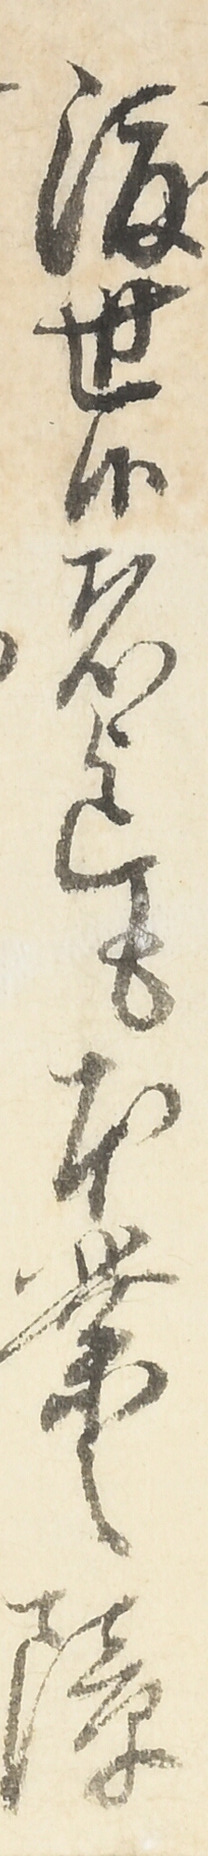渡世候者迄も本業之障
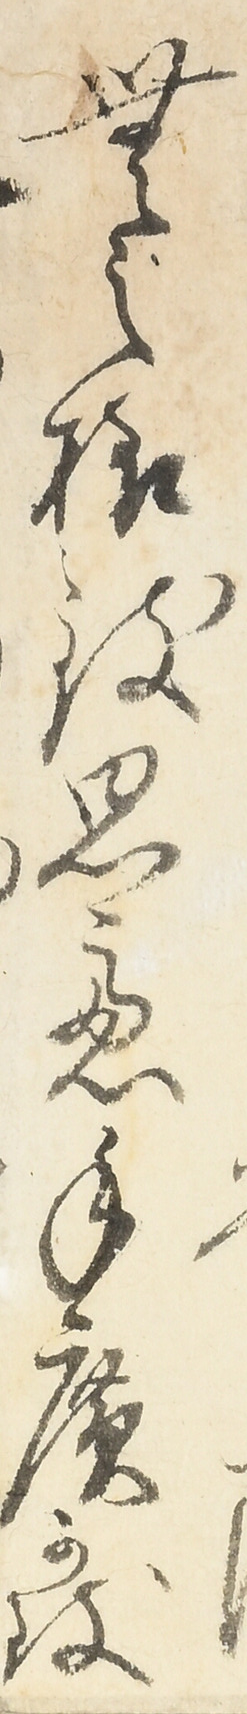無之様致思慮手広可致
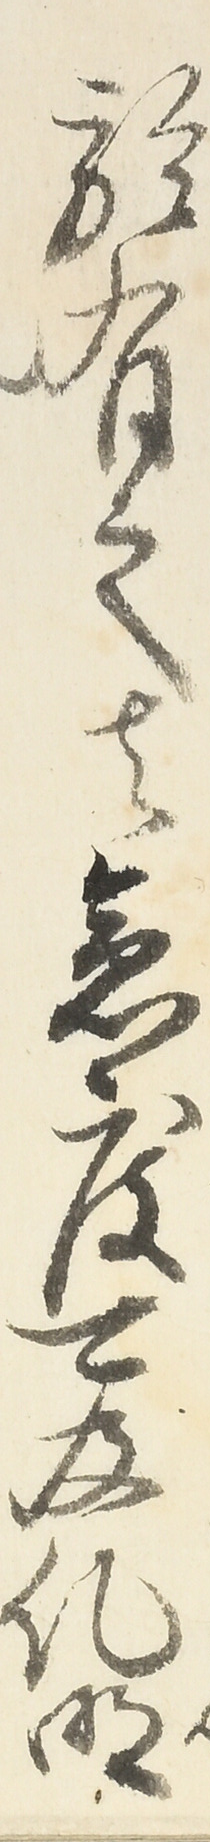於有之者急度可及糺明
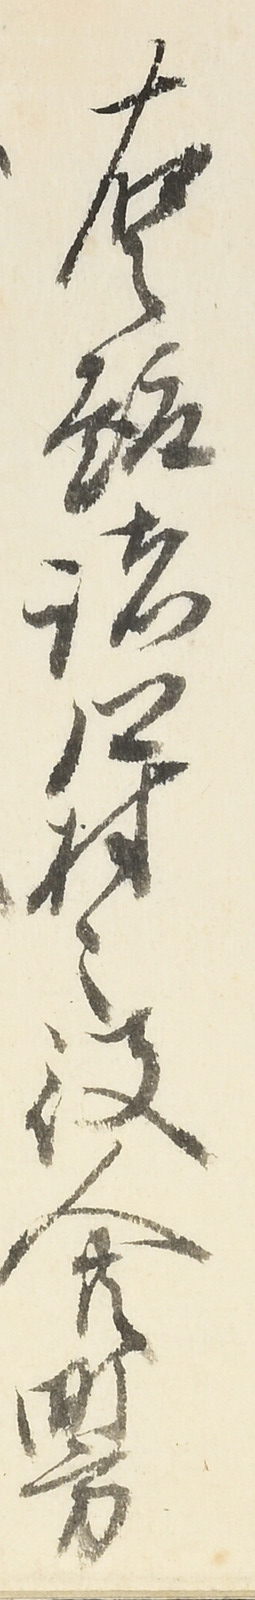右之趣諸郷村々役人共町方
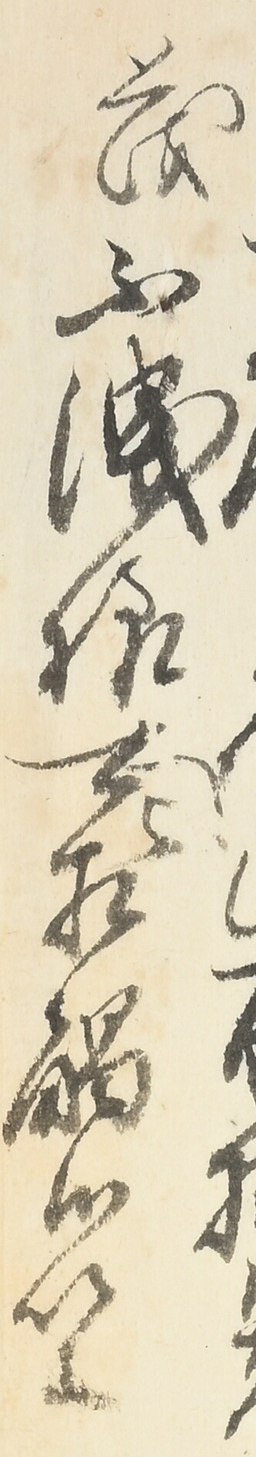茂不洩様可相触候以上
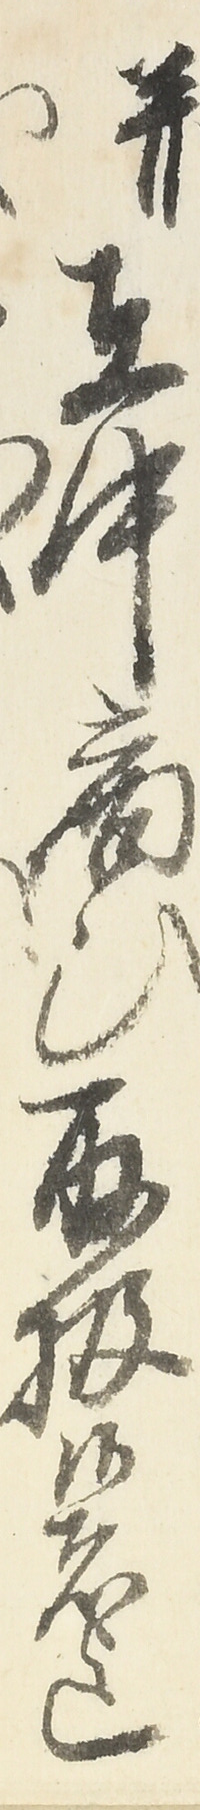幷在中商ひ取扱候者迄
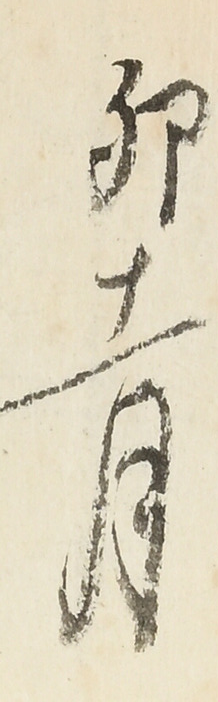卯十一月
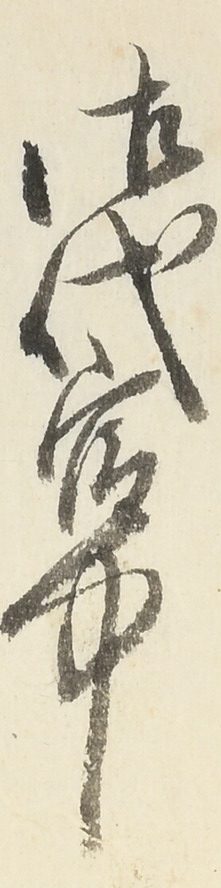御代官中
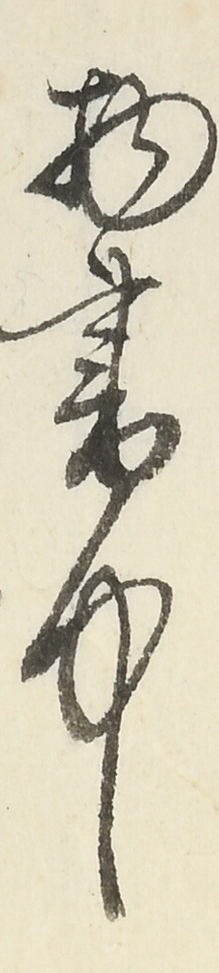物書中
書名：町方江別紙申渡
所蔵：伊那市立高遠町図書館・合同会社AMANE
